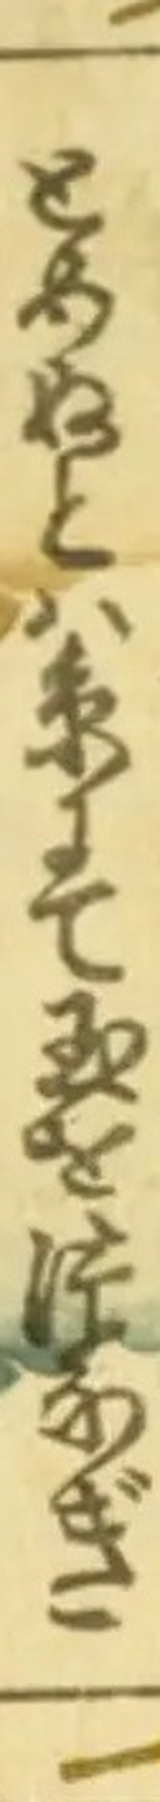とめぬとは糸にて玉をつなぎ
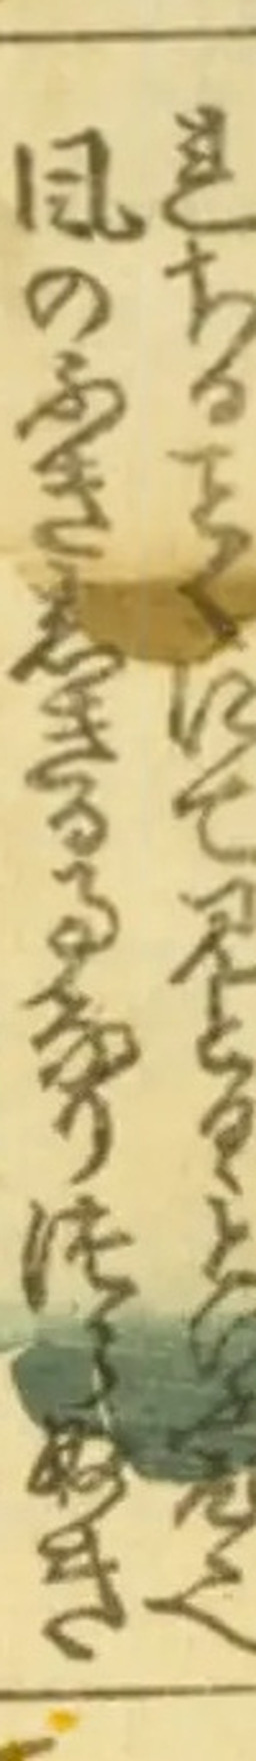風のふきしきる事なりつらぬき
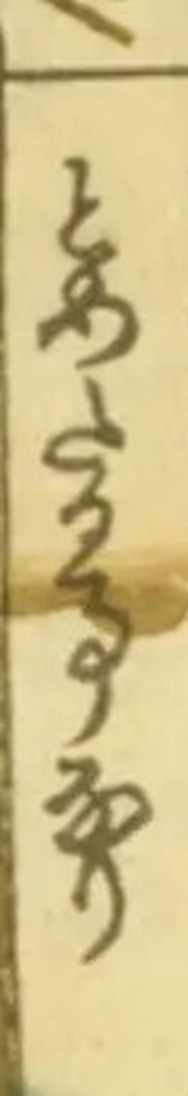とめたる事なり
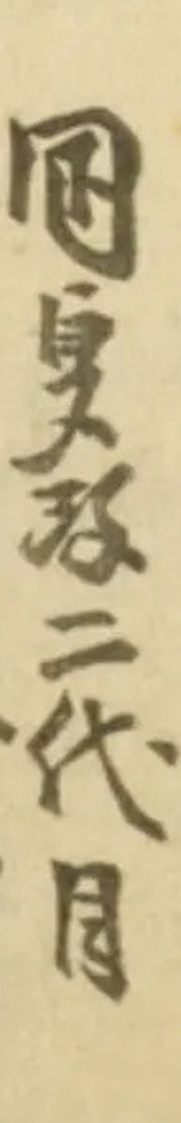国貞改二代目
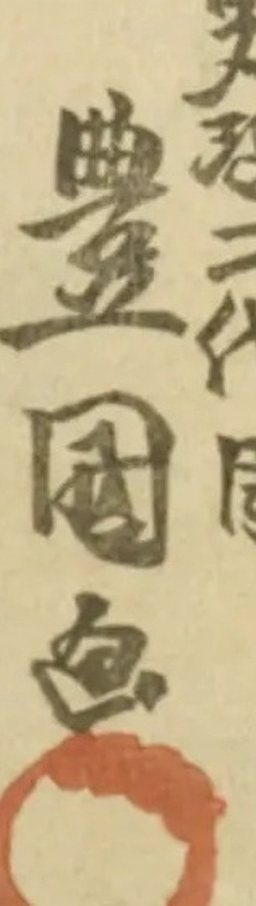豊国画
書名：百人一首絵抄 三十六 文屋朝康
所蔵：国立国会図書館 National Diet Library, JAPAN
